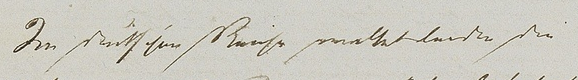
Im deutschen Reiche waltet leider die
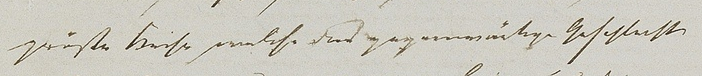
gröste Krise welche das gegenwärtige Geschlecht
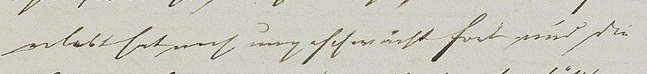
erlebt hat noch ungeschwächt fort und die
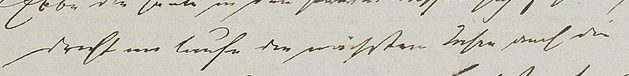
droht im Laufe der nächsten Jahre auch die
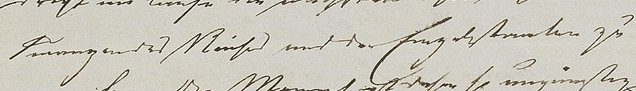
Finanzen des Reiches und der Einzelstaaten zu
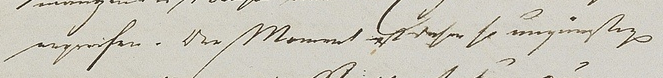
ergreifen. Der Moment ist daher so ungünstig,
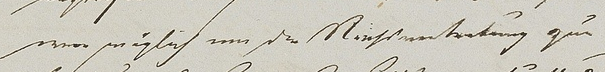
wie möglich um die Reichsvertretung zur
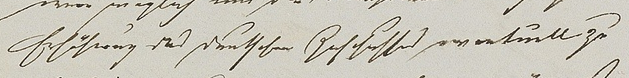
Erhöhung des deutschen Zuschusses eventuell zu
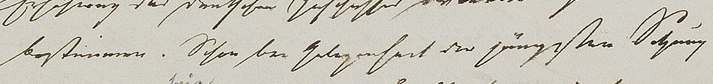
bestimmen. Schon bei Gelegenheit der jüngsten Sitzung
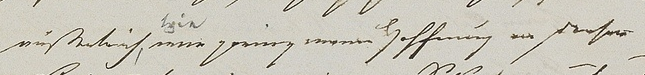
äußerte ich wie gering eine Hoffnung in dieser
